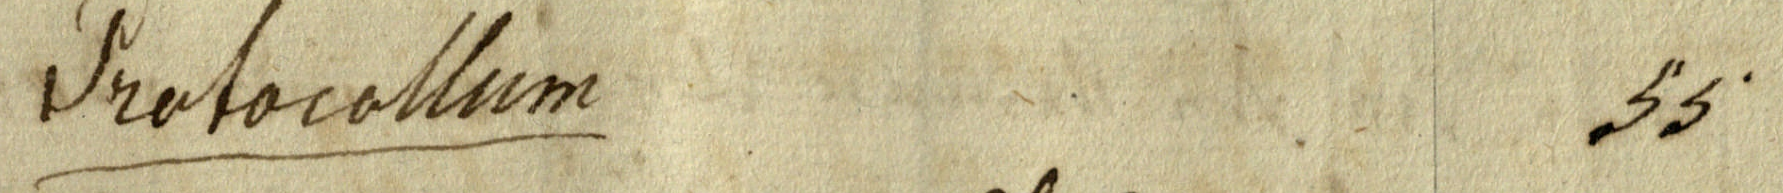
Protocollum
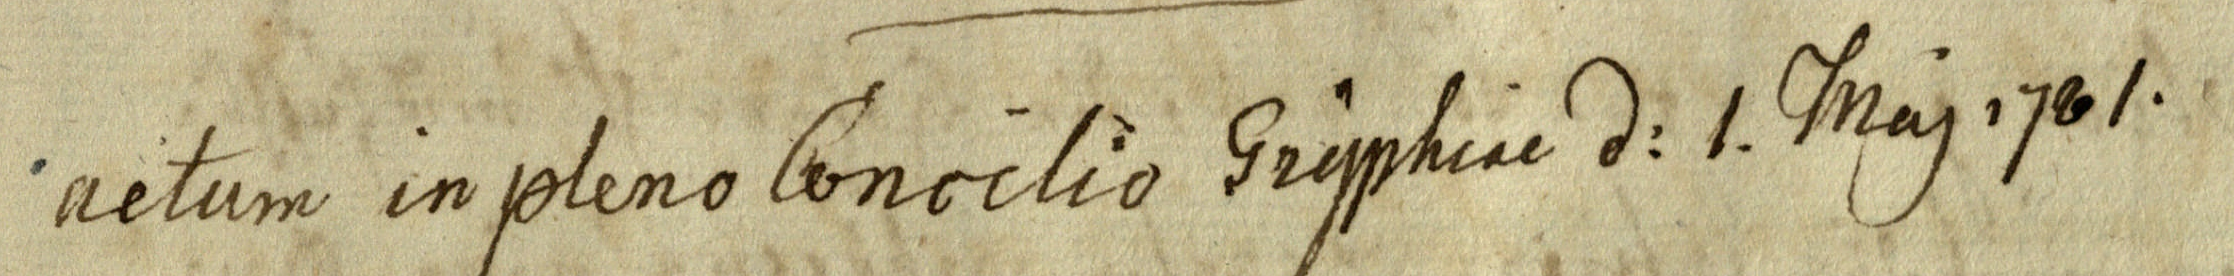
actum in pleno Concilio Grÿphiae d. 1. Maj 1781.
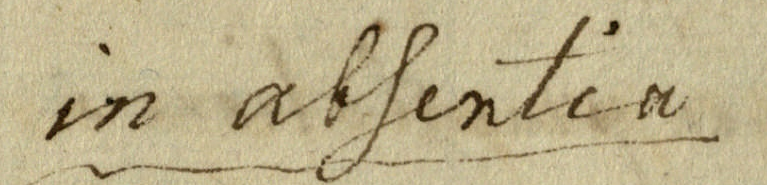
in absentia
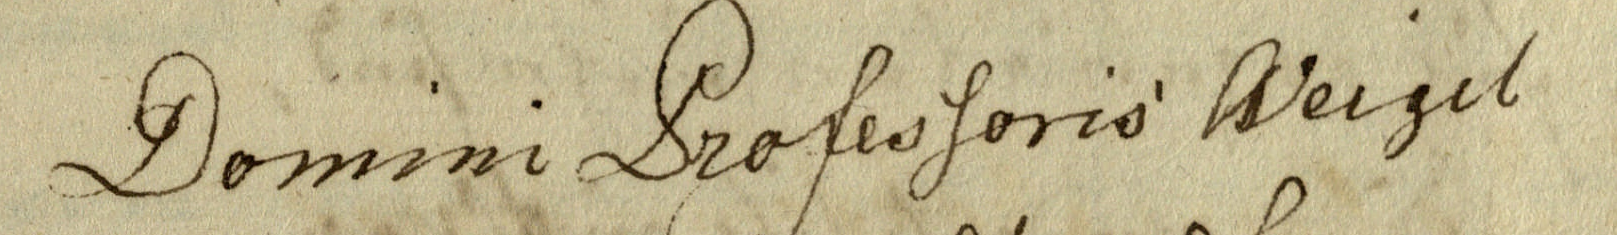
Domini Professoris Weigel
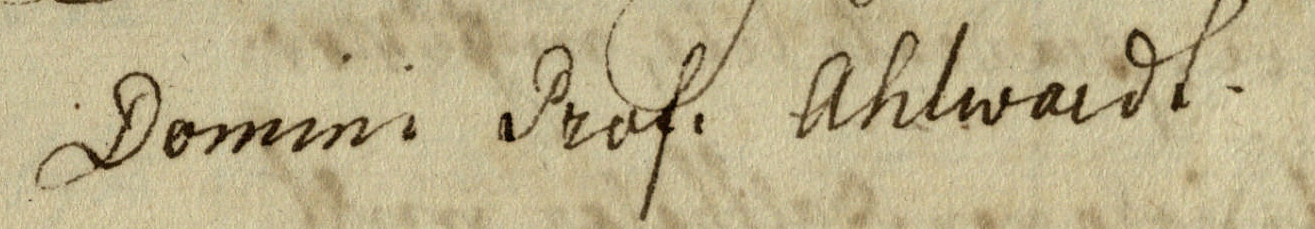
Domini Prof. Ahwardt.
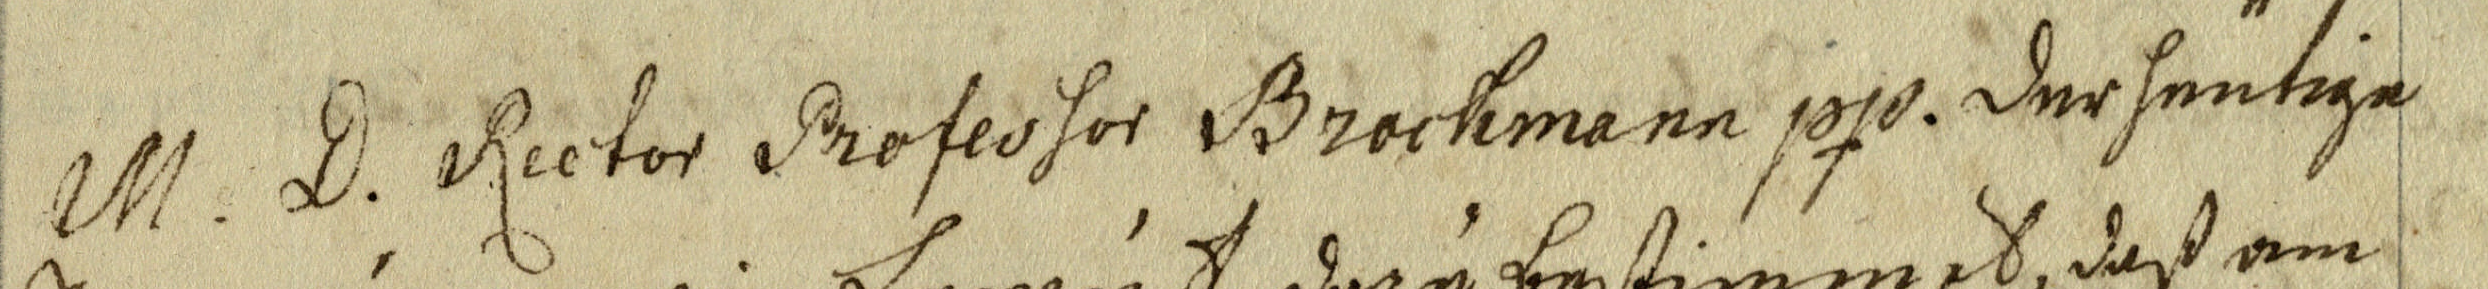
M. D. Rector Professor Brockmann pp. Der heutige
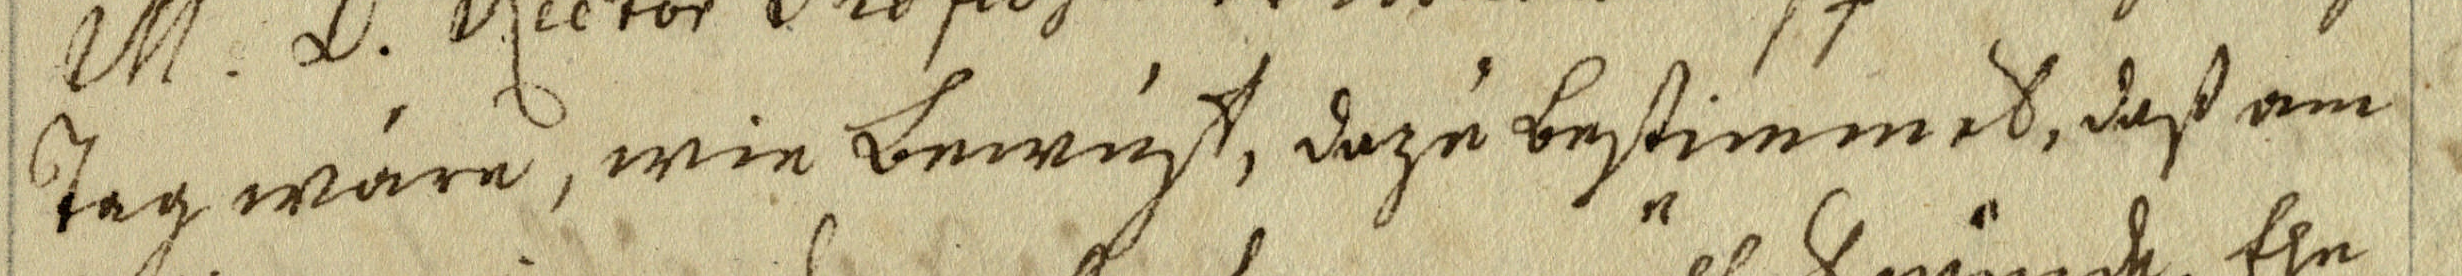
Tag wäre, wie bewust, dazu bestimmet, daß am
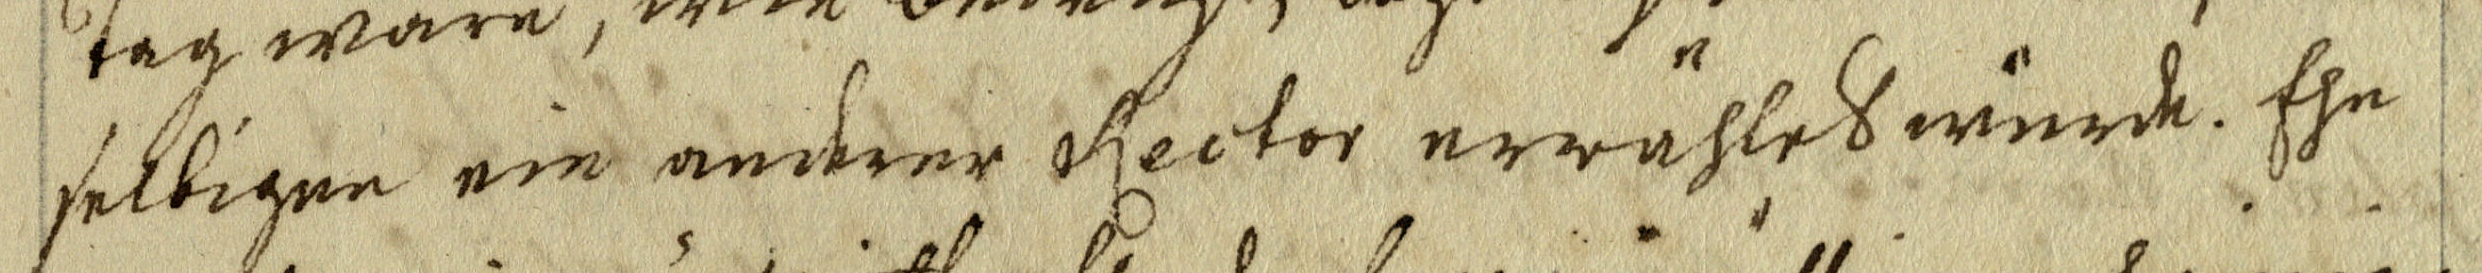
selbigen ein anderer Rector erwählet würde. Ehe
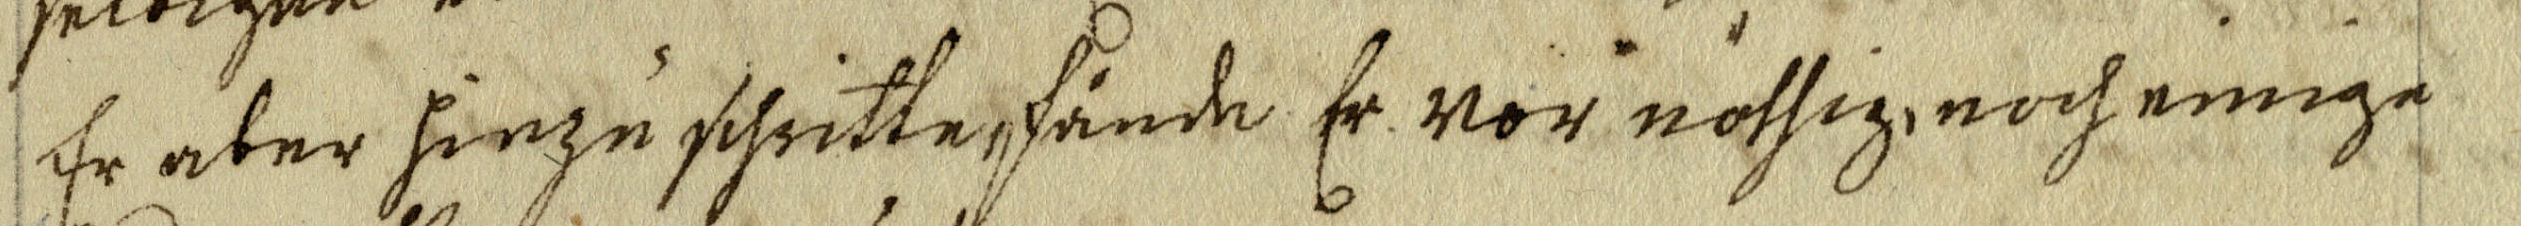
Er aber hiezu schritte, fände Er vor nöthig, noch einige
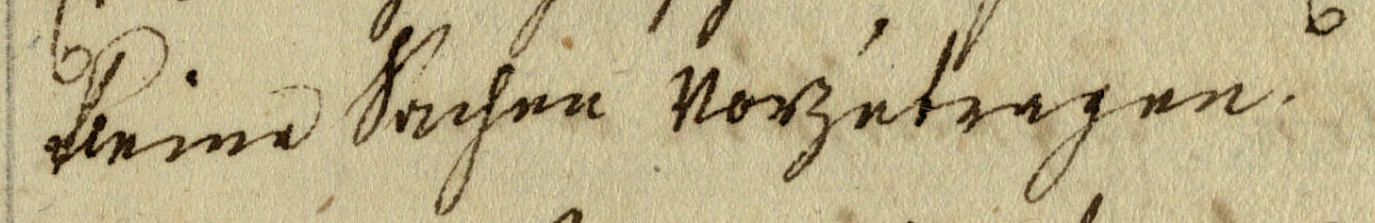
kleine Sachen vorzutragen.
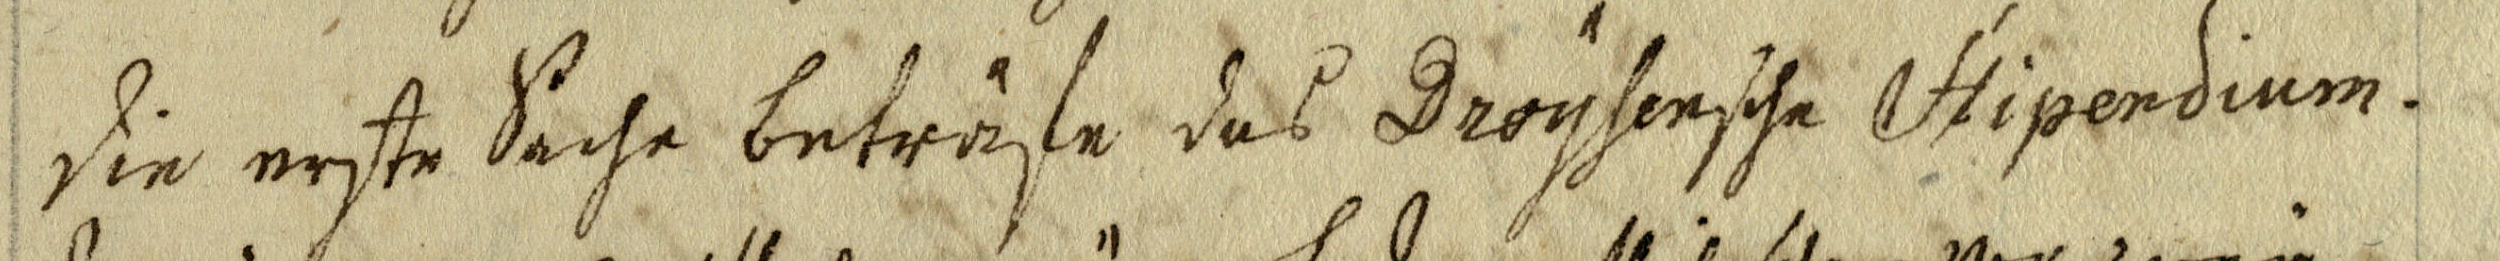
Die erste Sache beträfe das Droÿsensche Stipendium.
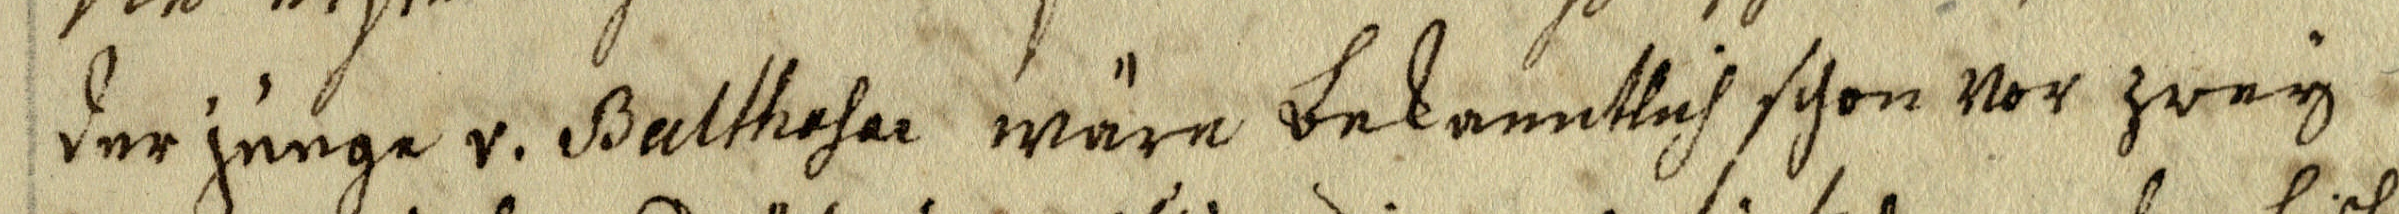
der junge v. Balthasar wäre bekanntlich schon vor zweÿ
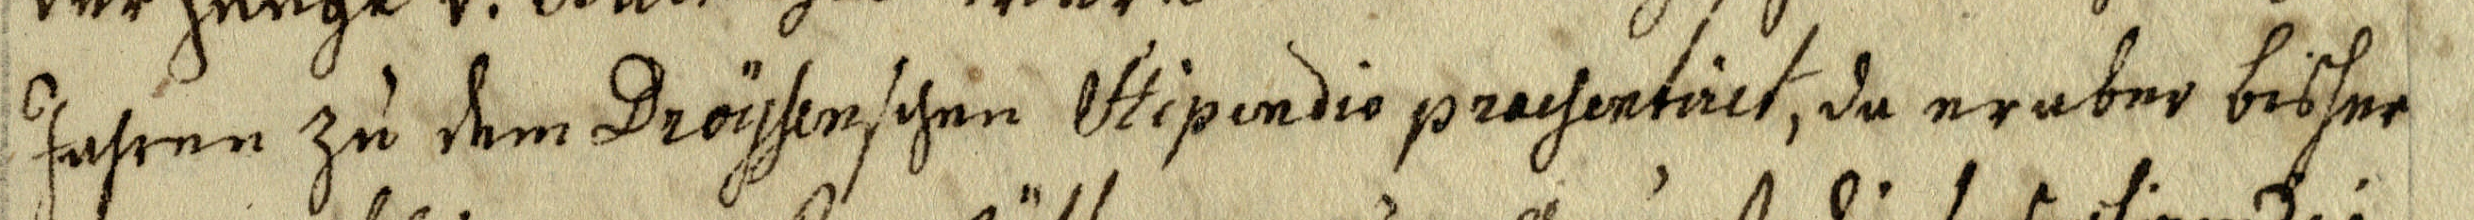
Jahren zu dem Droÿsenschen Stipendio praesentiret, da er aber bisher
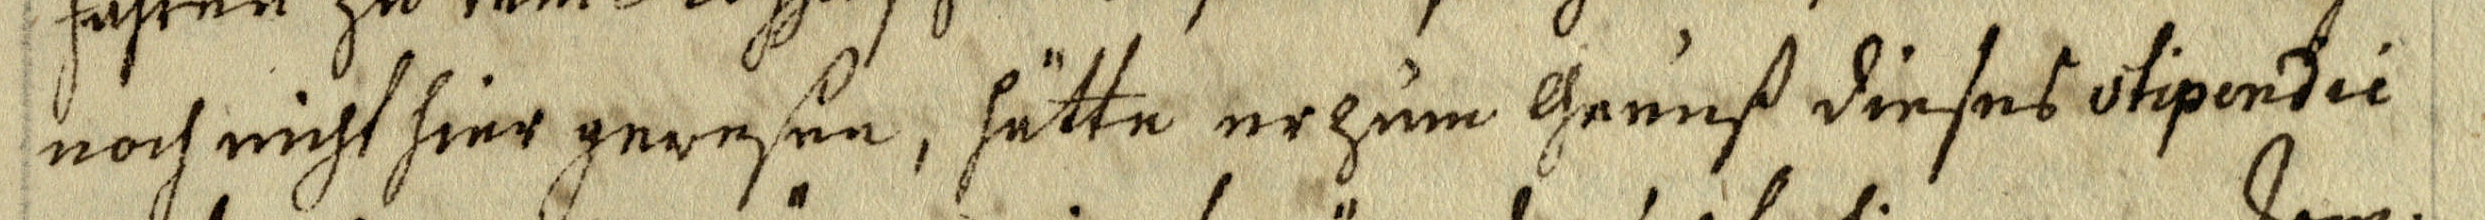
noch nicht hier gewesen, hätte er zum Genuß dieses stipendii
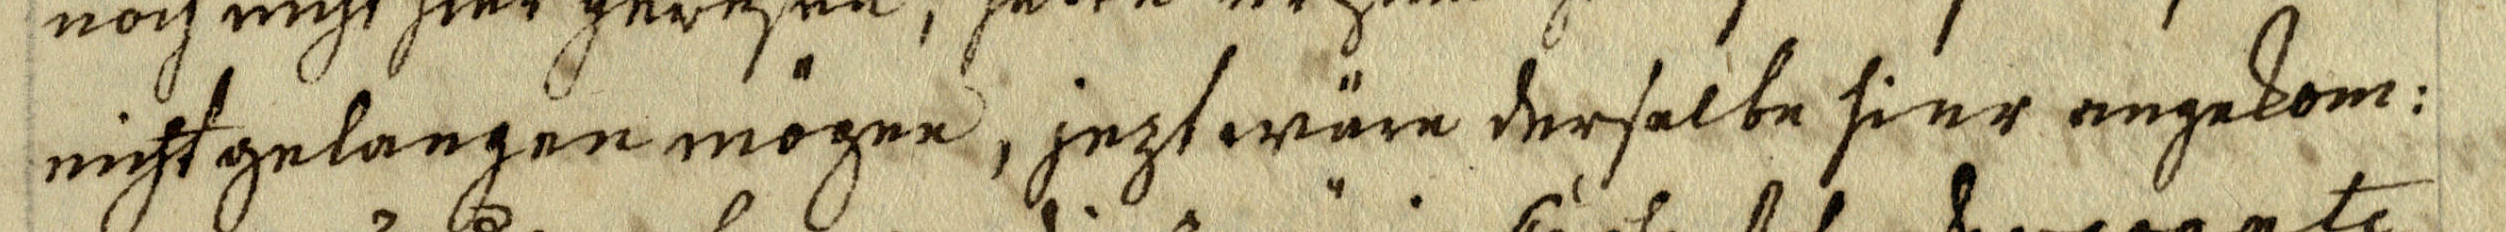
nicht gelangen mögen, jezt wäre derselbe hier angekom¬
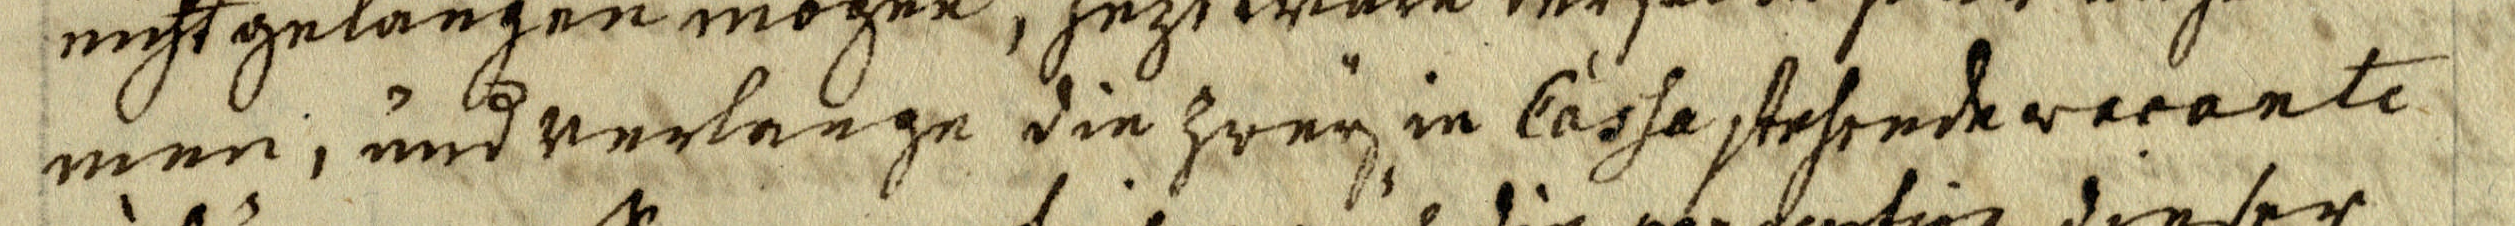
men, und verlange die zweÿ in Cassa stehende vacante
